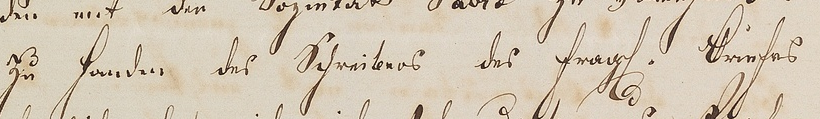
Zu Handen des Schreibers des fragl. Briefes
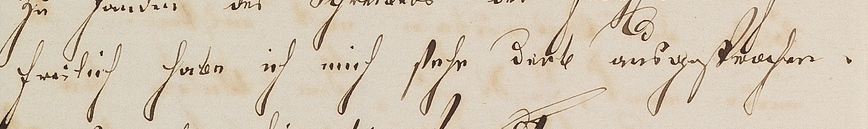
freilich habe ich mich sehr deutl ausgesprochen.
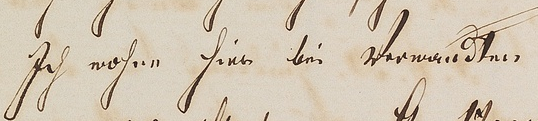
Ich wohne hier bei Verwandten
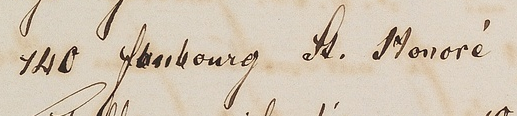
140 Faubourg St. Honoré
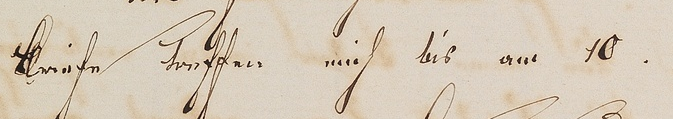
Briefe treffen mich bis am 10.
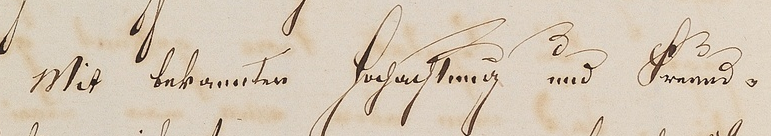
Mit bekannter Hochachtung und Freund-
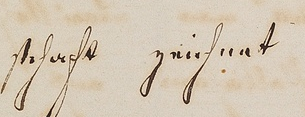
schaft zeichnet
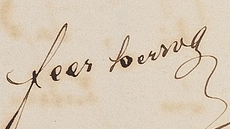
Feer Herzog
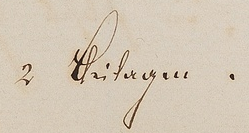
2 Beilagen.
